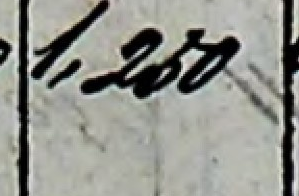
1,250
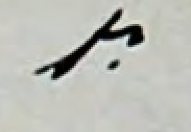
do
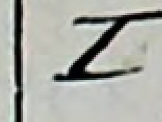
I
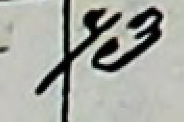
73
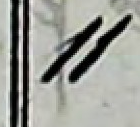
11
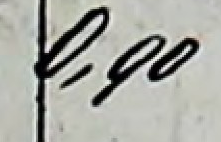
0,90
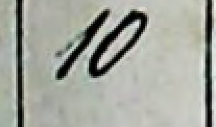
10
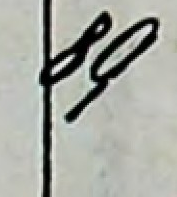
89
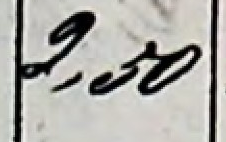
2,50
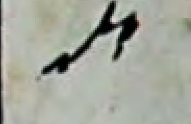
do
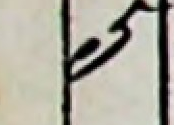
5
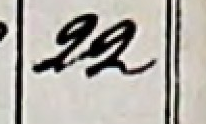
22
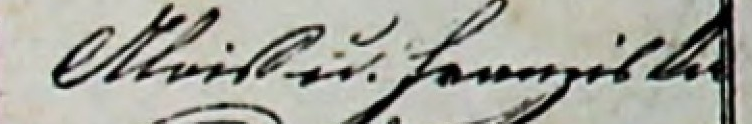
Alois u. Franziska
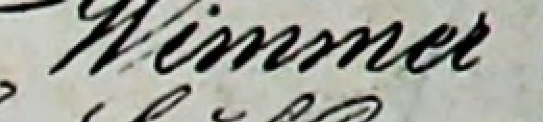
Wimmer
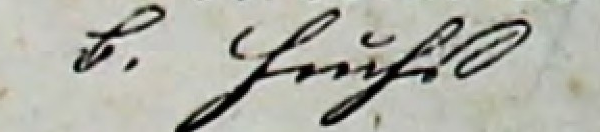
v. Fuchs
